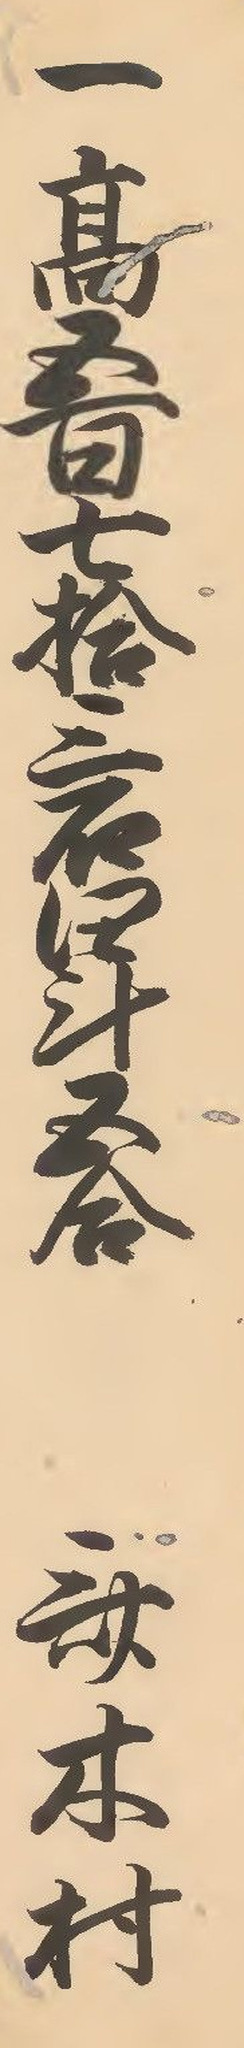一髙五百七拾三石四升五合齋木村
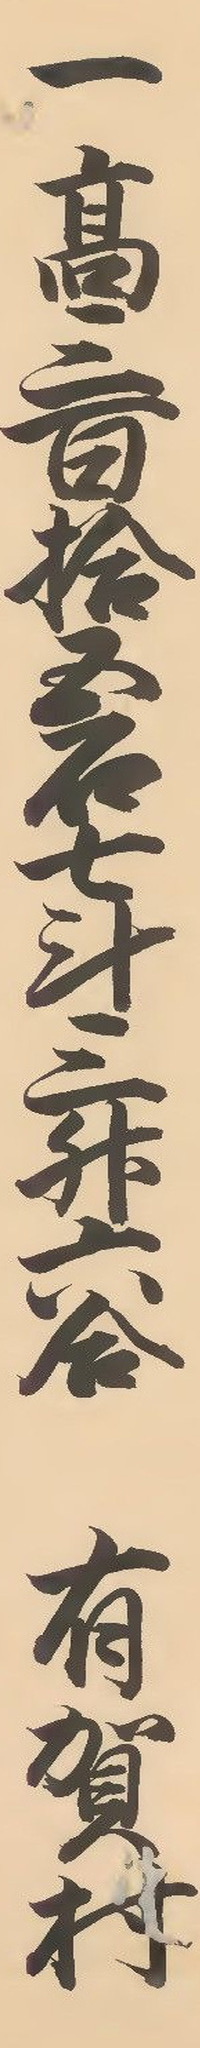一髙三百拾五石七斗三升六合有賀村
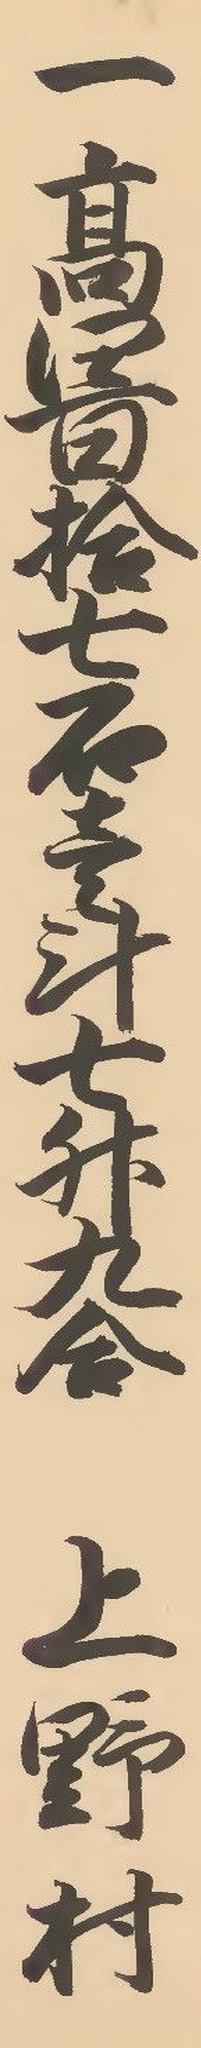一髙四百拾七石壱斗七升九合上野村
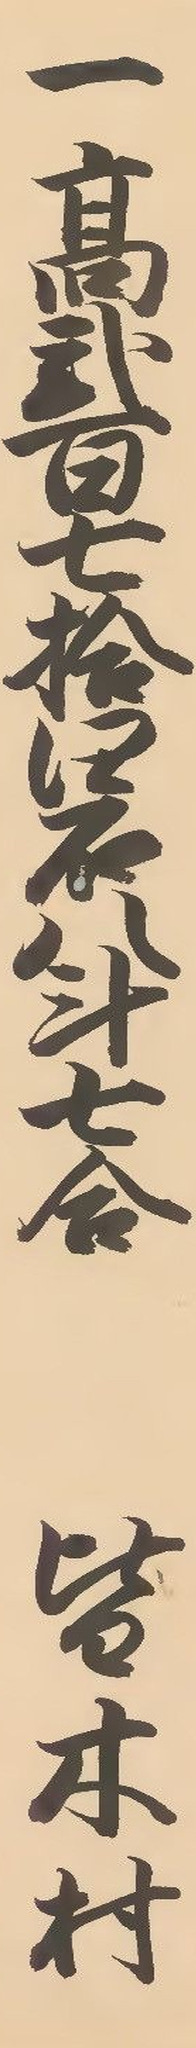一髙弐百七拾四石八斗七合皆木村
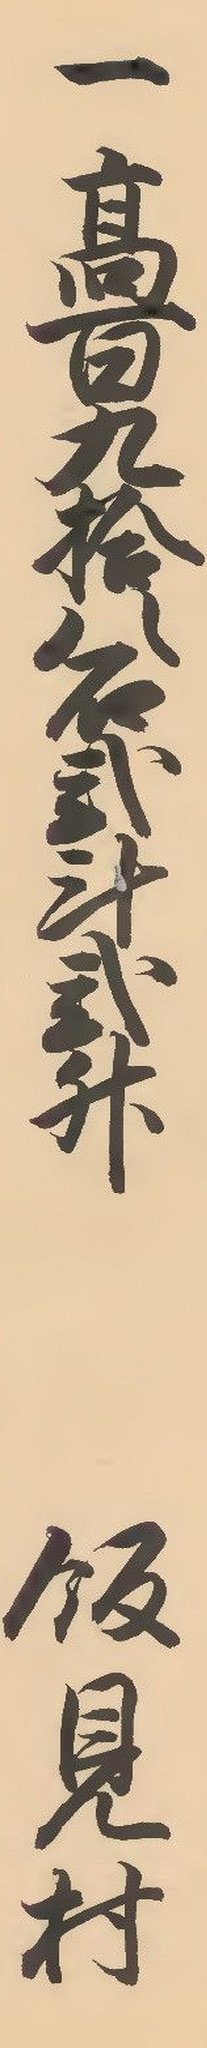一髙百九拾八石弐斗弐升飯見村
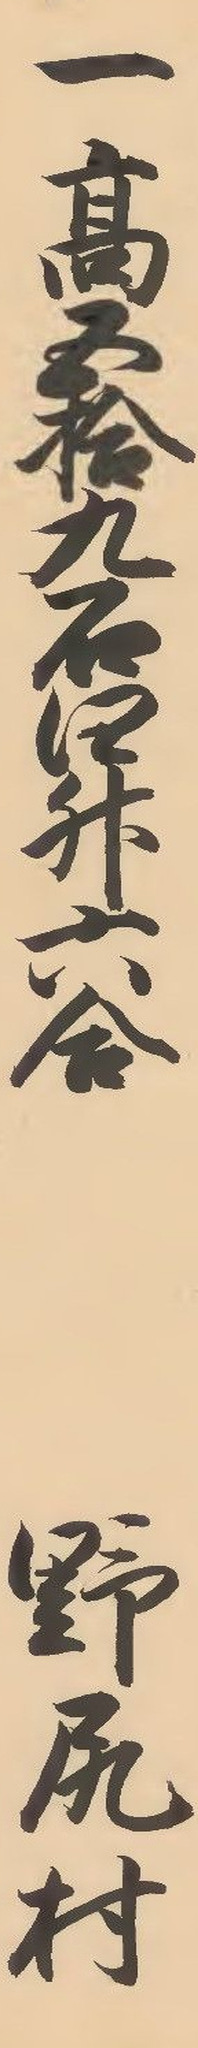一髙五拾九石四升六合野尻村
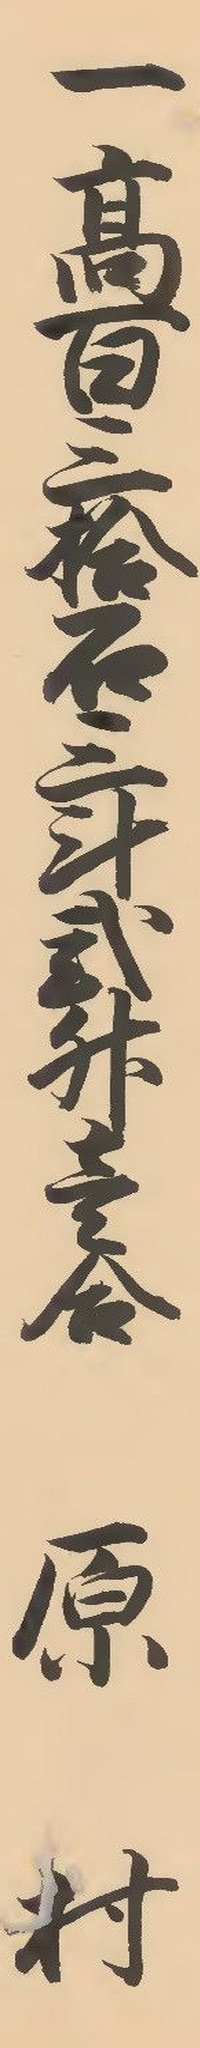一髙百三拾石三斗弐升壱合原村
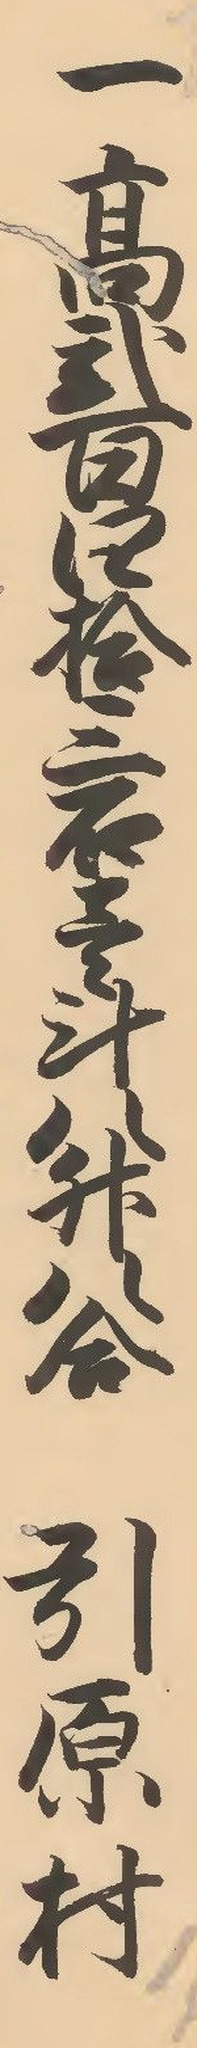一髙弐百四拾三石壱斗八升八合引原村

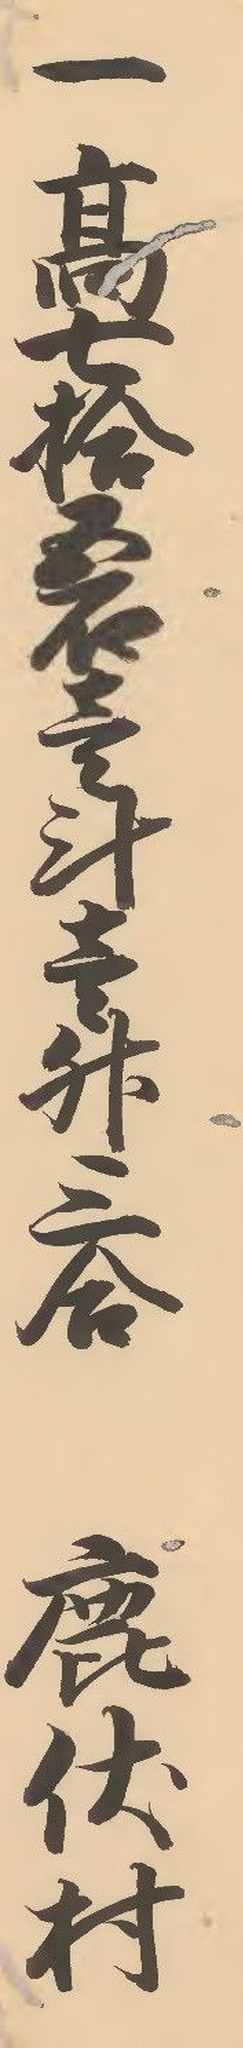一髙七拾五石壱斗壱升三合鹿伏村
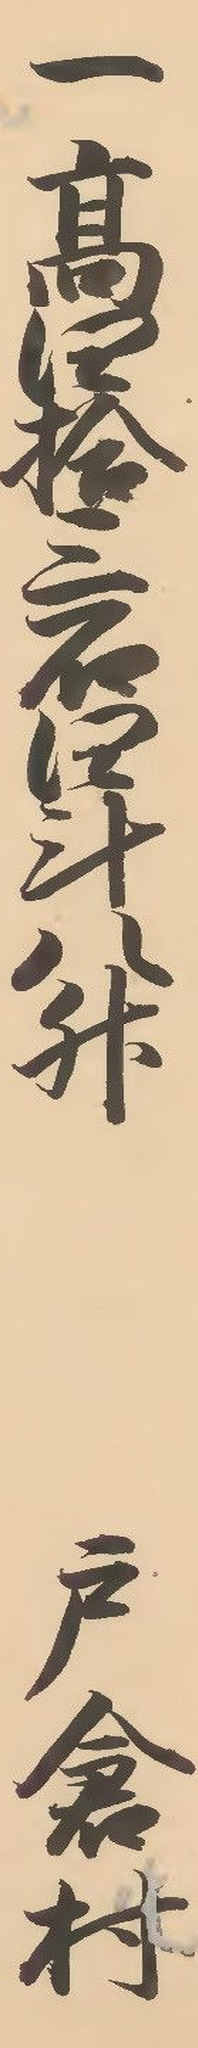一髙四拾三石四斗八升戸倉村
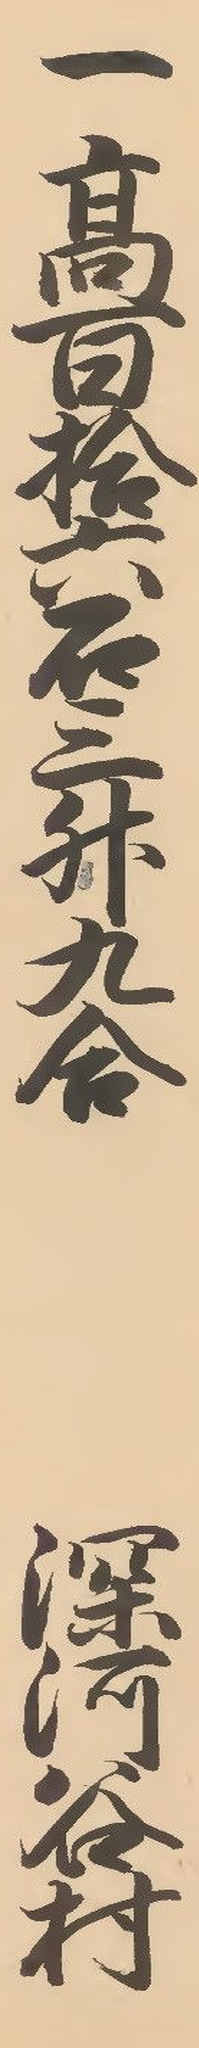一髙百拾六石三升九合深河谷村
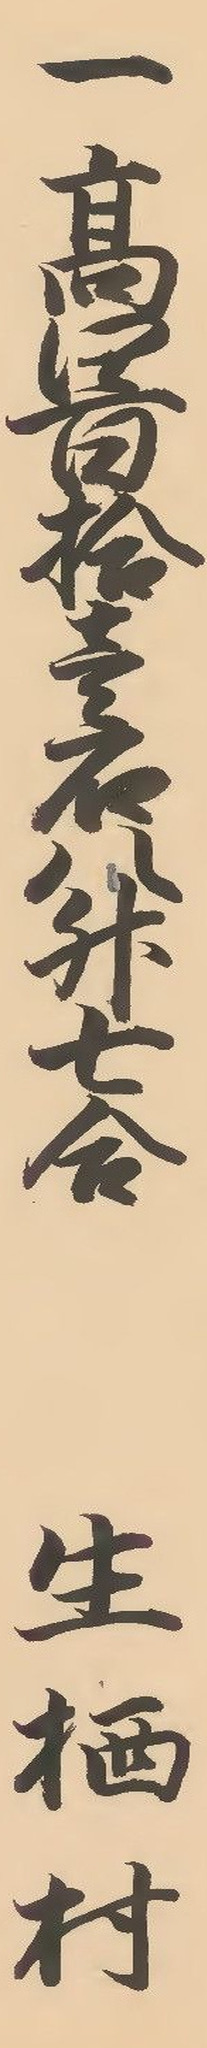一髙四百拾壱石八升七合生栖村
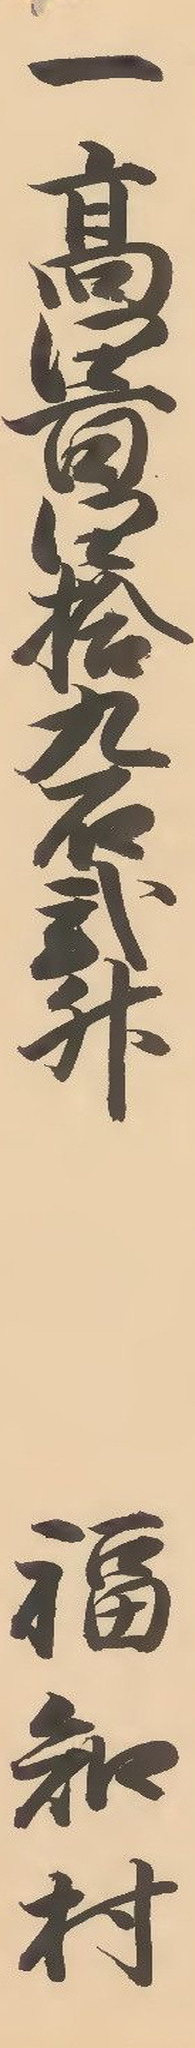一髙四百四拾九石弐升福知村
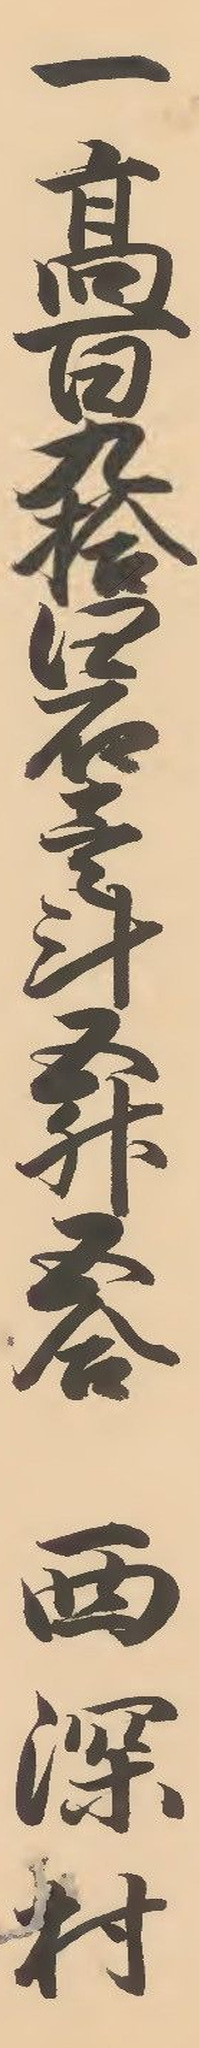一髙百九拾四石壱斗五升五合西深村
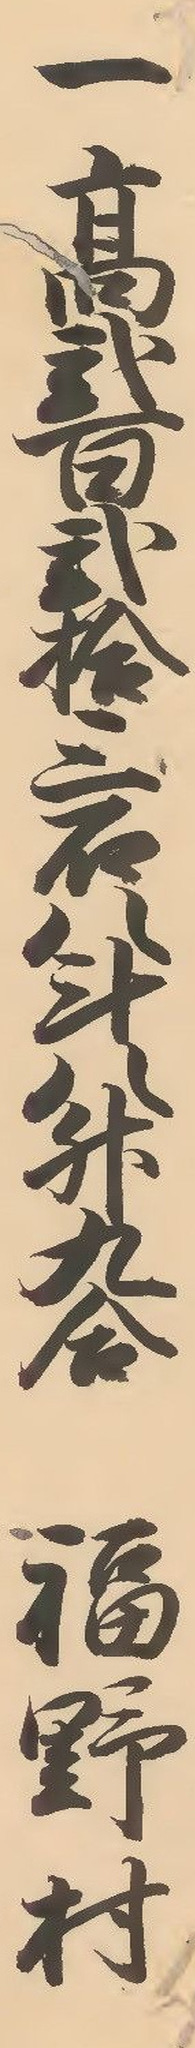一髙弐百弐拾三石八斗八升九合福野村

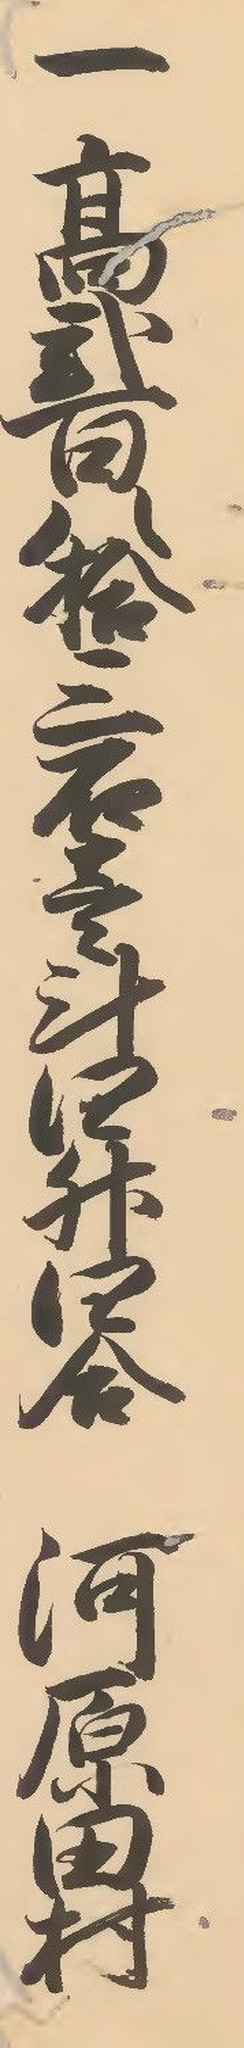一髙弐百八拾三石壱斗四升四合河原田村
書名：播磨国郷帳
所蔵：国立公文書館 National Archives of Japan
